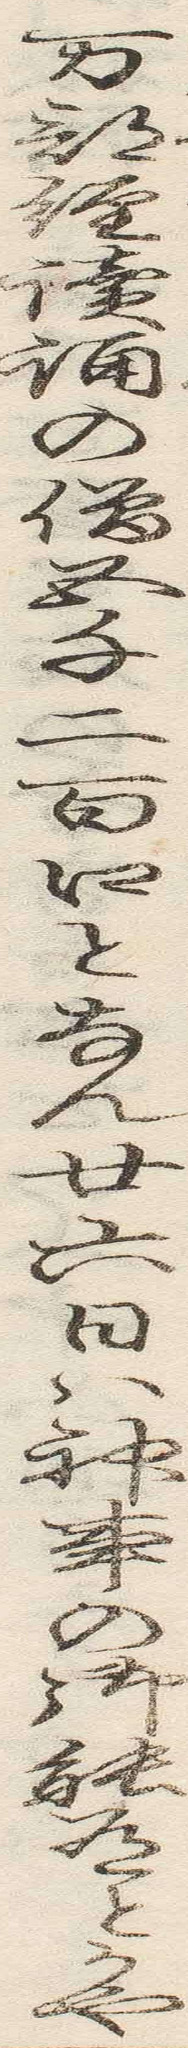万部經讀誦の僧五千二百口となん廿六日は神事の御能有とかや
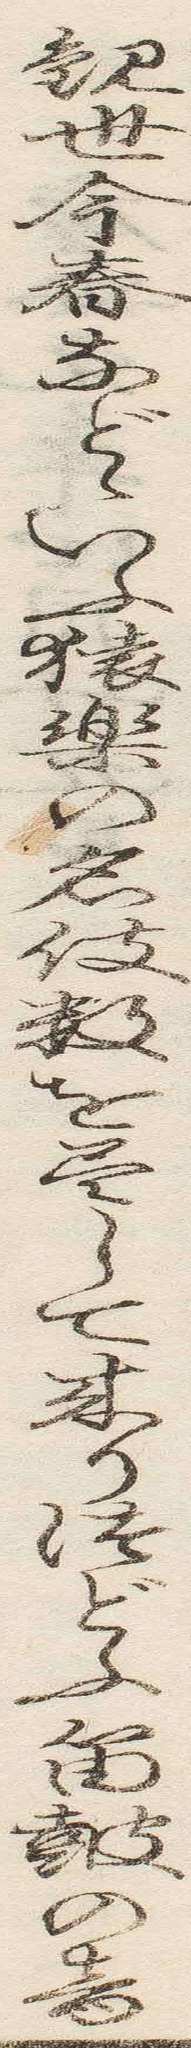觀世金春などゝいふ猿樂の名伎数を尽して來りつどふ笛皷の音
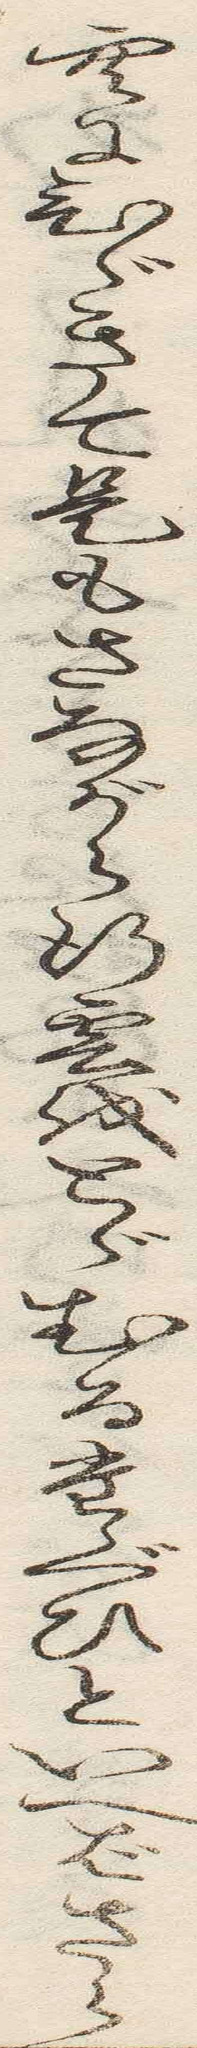空にひゞきて是もさながら行雲をとゞむるたぐひといへばさら
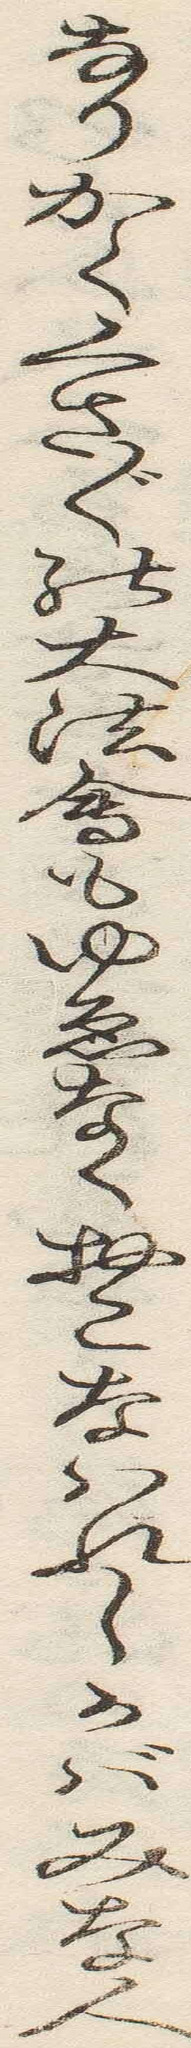なりかくくさ〴〵の大法會もゆゑなくおこなはれしかばみな人
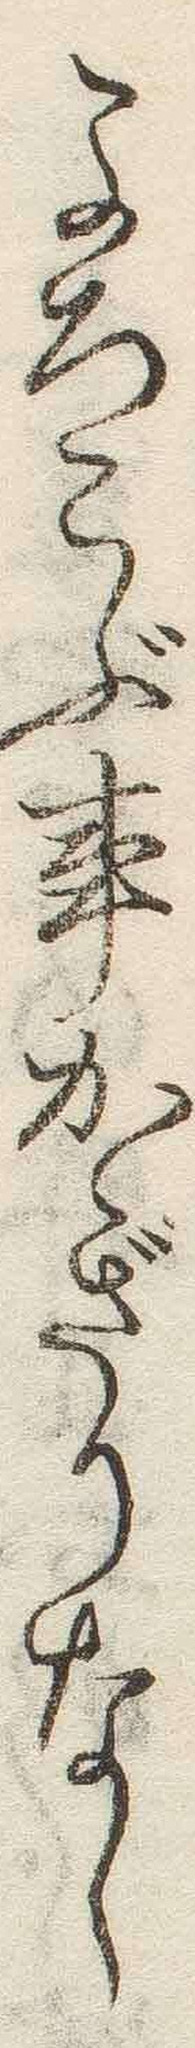よろこぶ事かぎりなし
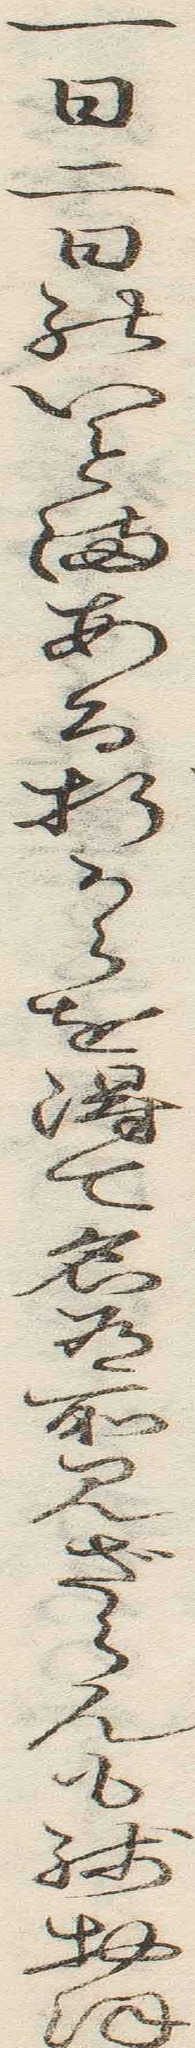一日二日のいとまある折からを得て名有所見ざらんも残おほ
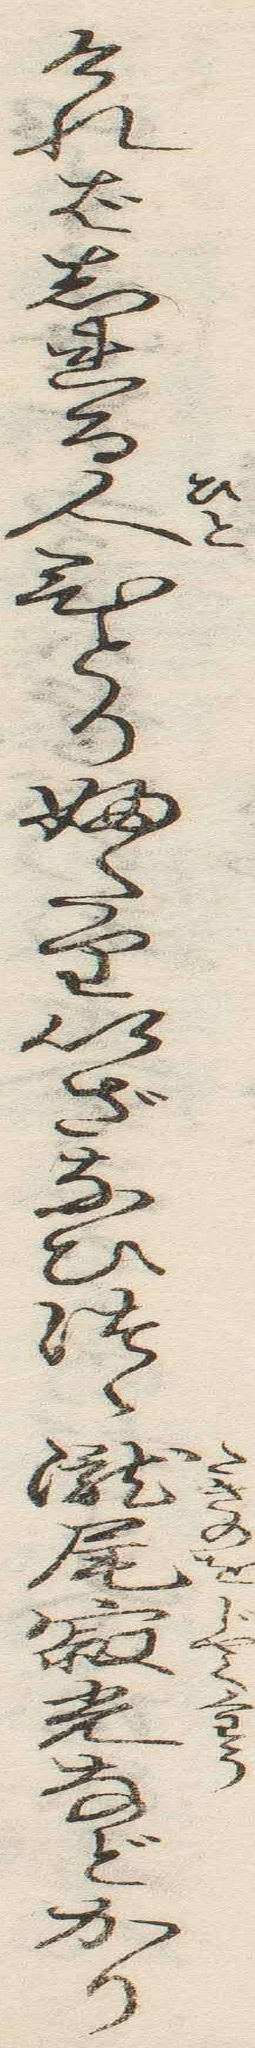ければしれる人ひとりふたりいざなひつゝ瀧尾寂光などかり
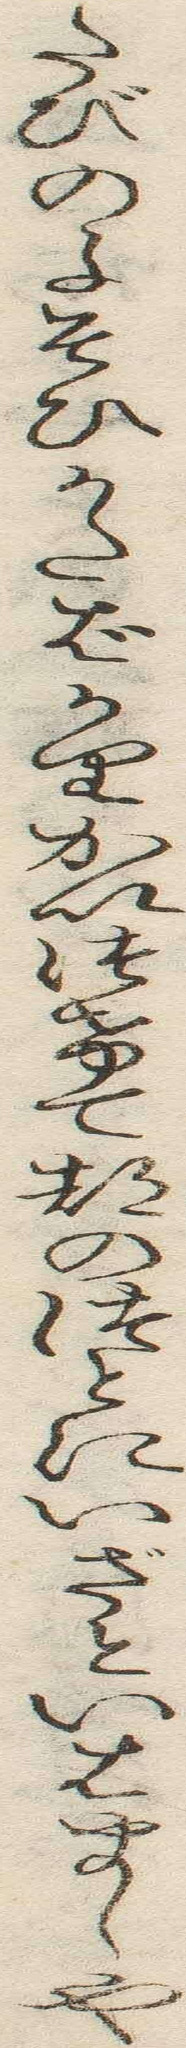たびのよそひかたばかりかいつけて都のつとにいざといはましや
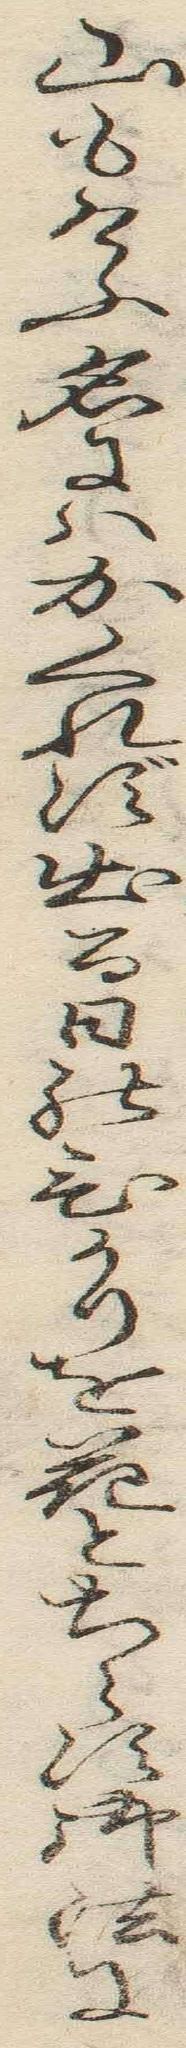山もけふ名にはかくれず出る日のひかりを花とちらす御法に

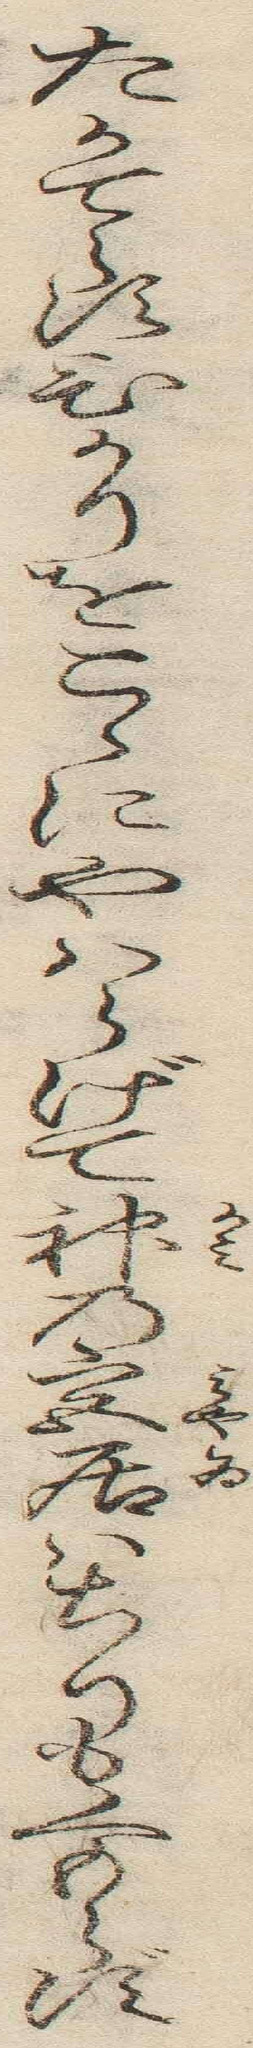たかてらすひかりをこゝにやはらげて神の宮居はちりもくもらず
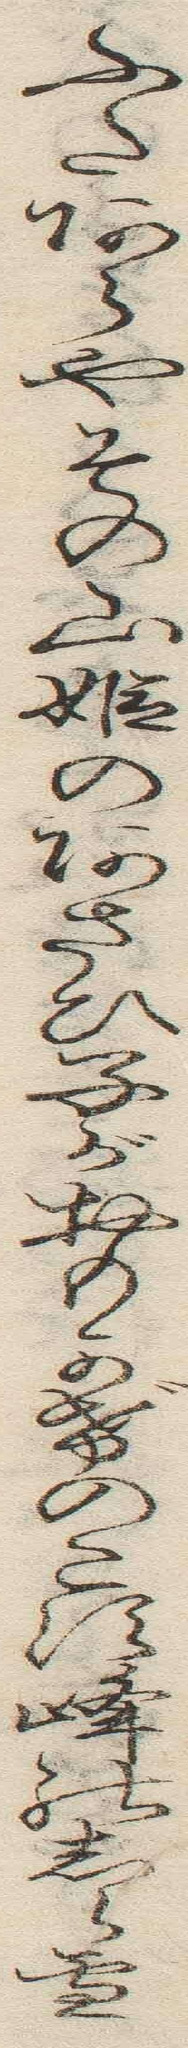ふたあらやその山姫のあさひ子がおもかげのこす峰のしら雪
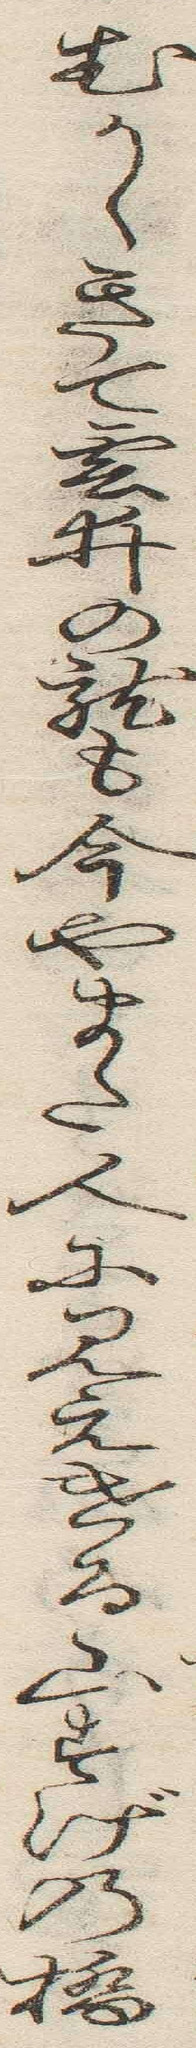むかしきて雲井の龍も今やまた人に見えける山すげの橋
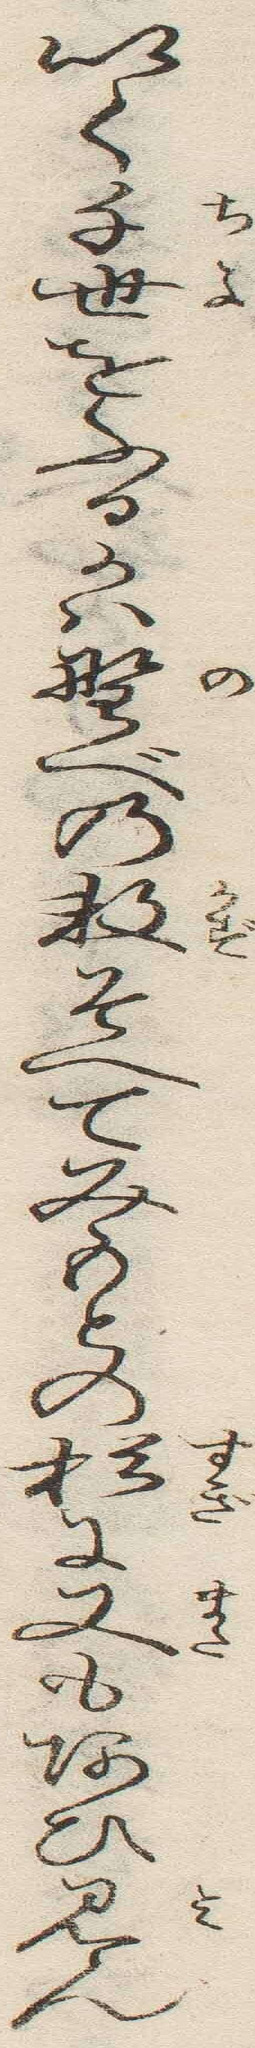いく千世をふるかは㙒べの数そへてみもとの杉に又もあひ見ん
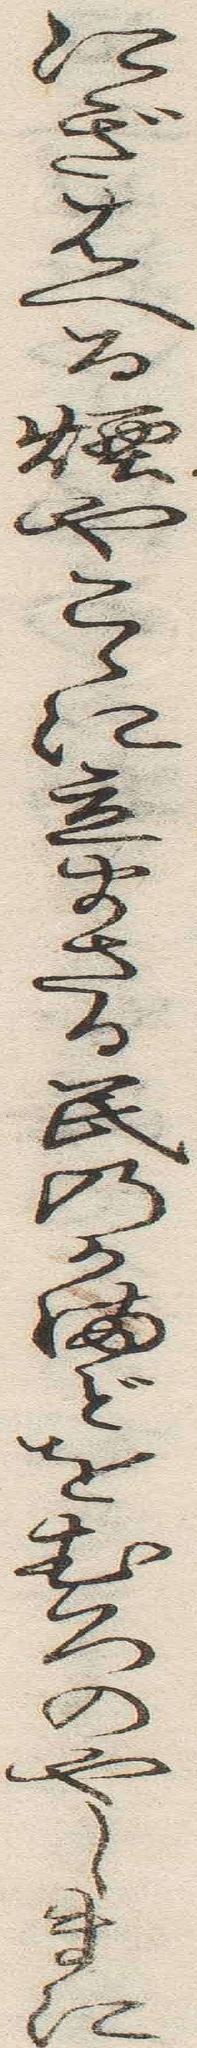にぎはへる煙やこゝに立まさる民のかまどをむろのやしまに
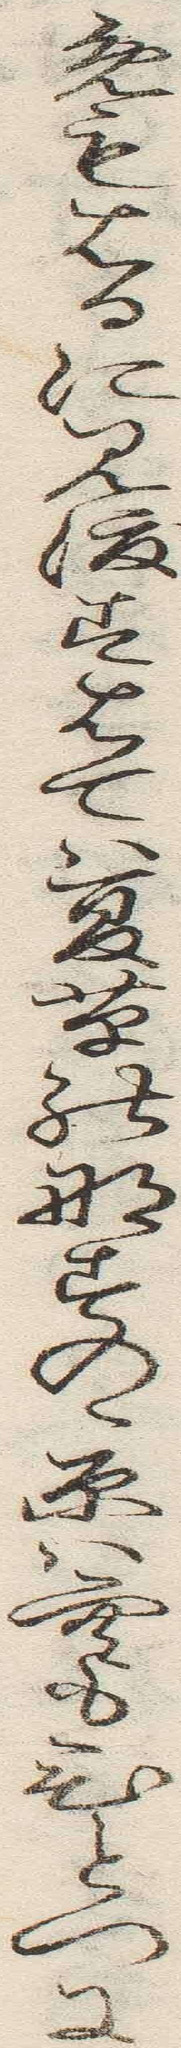めもはるに見渡すはては夏草のなすのゝ原は空もひとつに
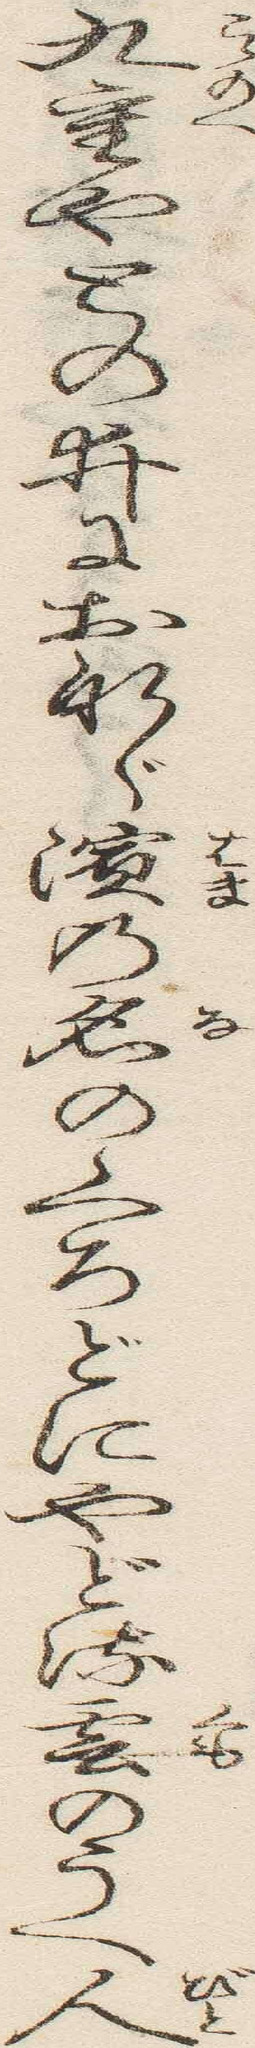九重やとの井におなじ濵の名のくろどにやどる雲のうへ人
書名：日光山志
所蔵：東京学芸大学附属図書館 国文学研究資料館
